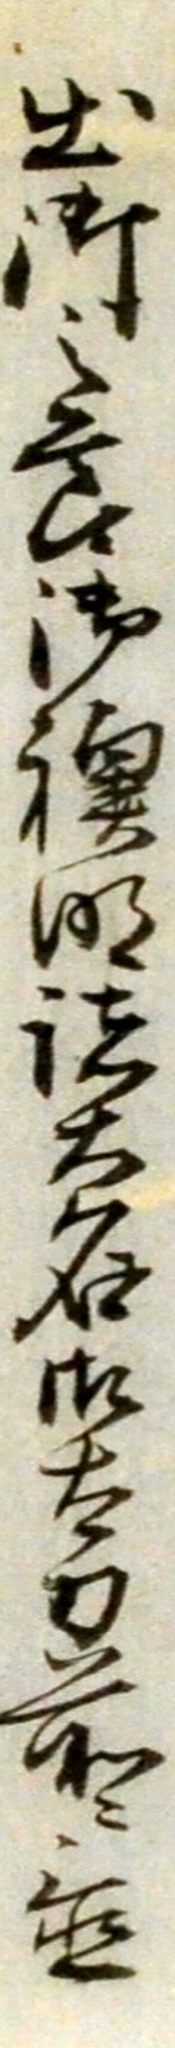出御之節御襖明諸大名御太刀前に置
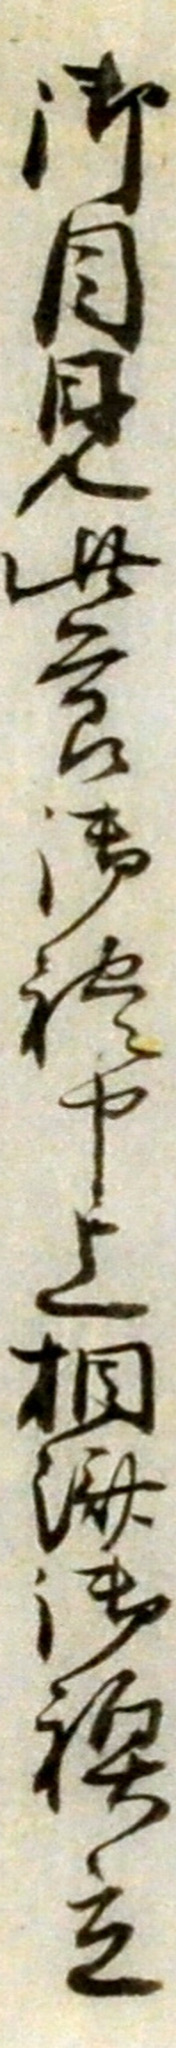御目見此節御礼申上相済御襖立
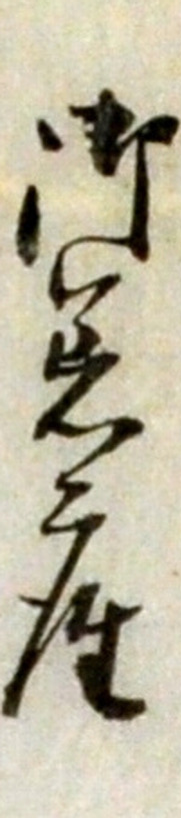御着座
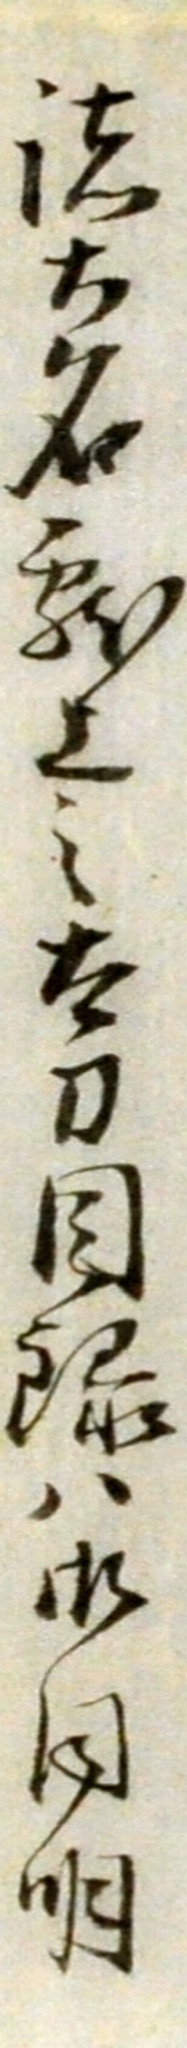諸大名献上之太刀目録は御目明
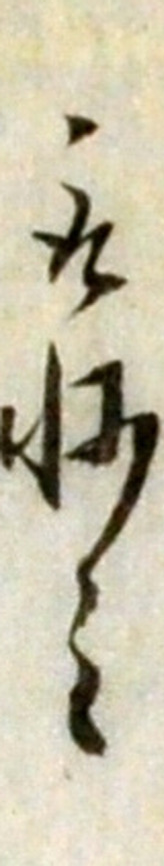取収之
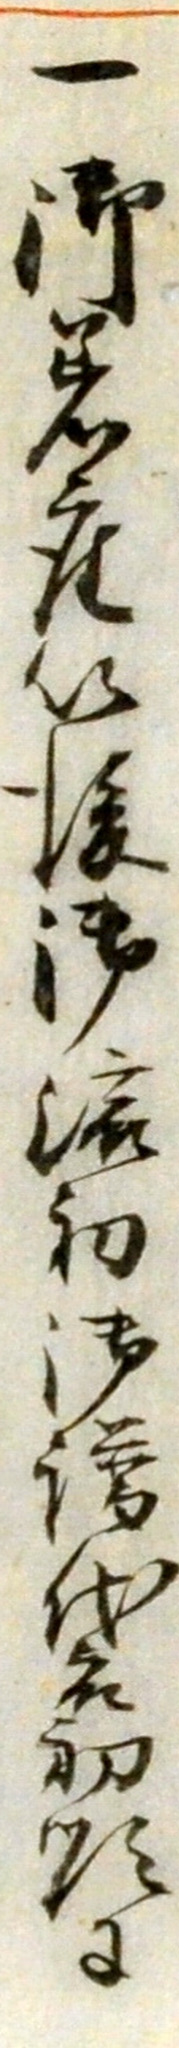一御着座以後御流初御譜代衆初順に
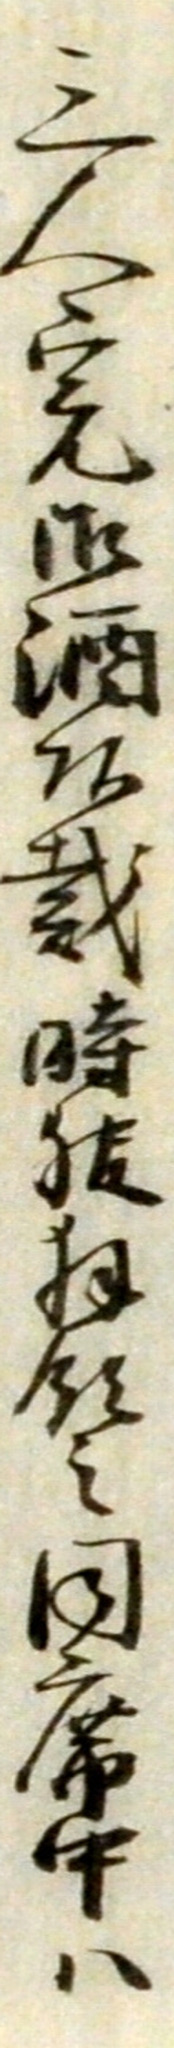三人宛御酒頂戴時服拝領之同席中は
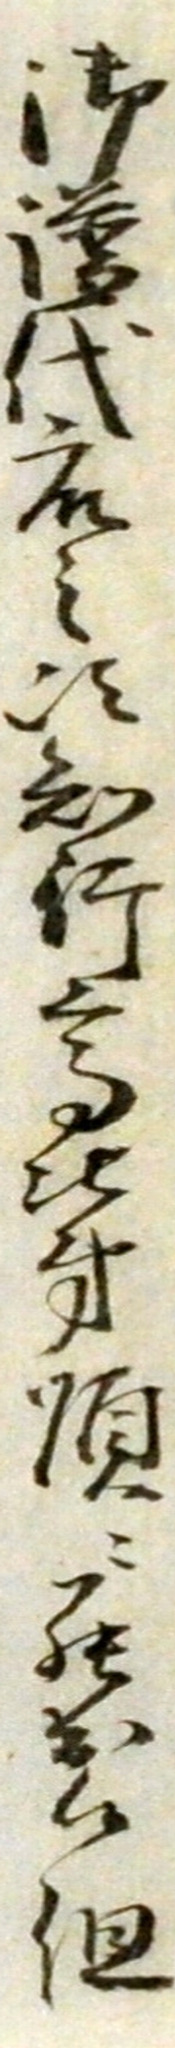御譜代衆之次知行高次第順に罷出候但
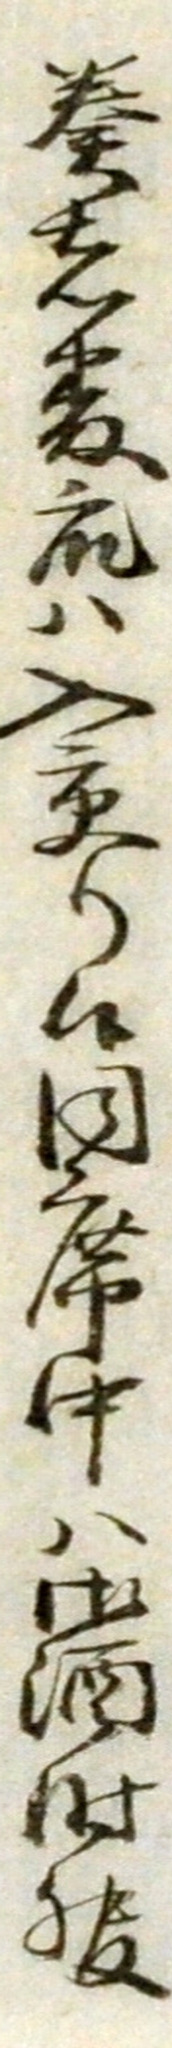奏者番衆は入交り候同席中は御酒時服
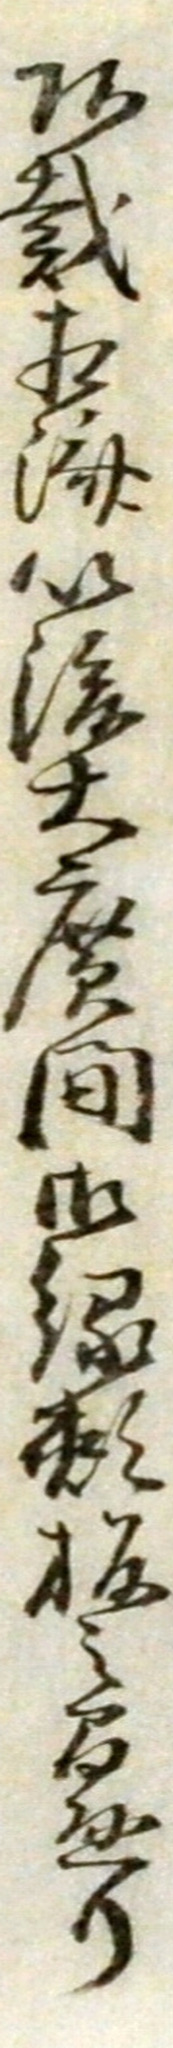頂戴相済以後大広間御縁頬板之間と通り
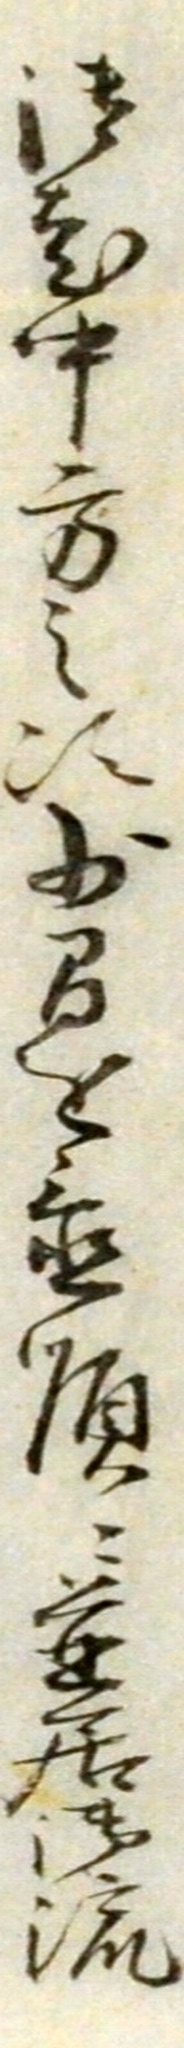御老中方之次少間を置順に並居御流
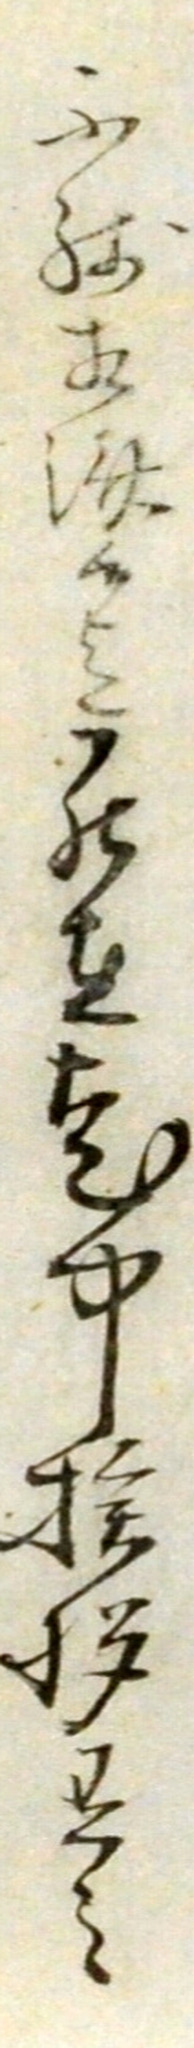不残相済候迄罷在老中挨拶有之
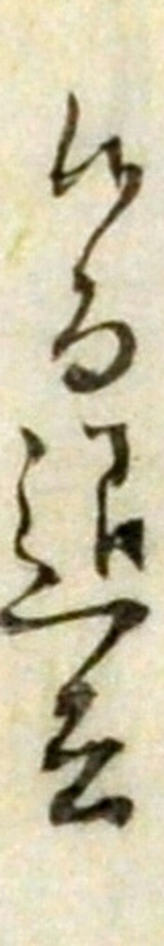候て退去
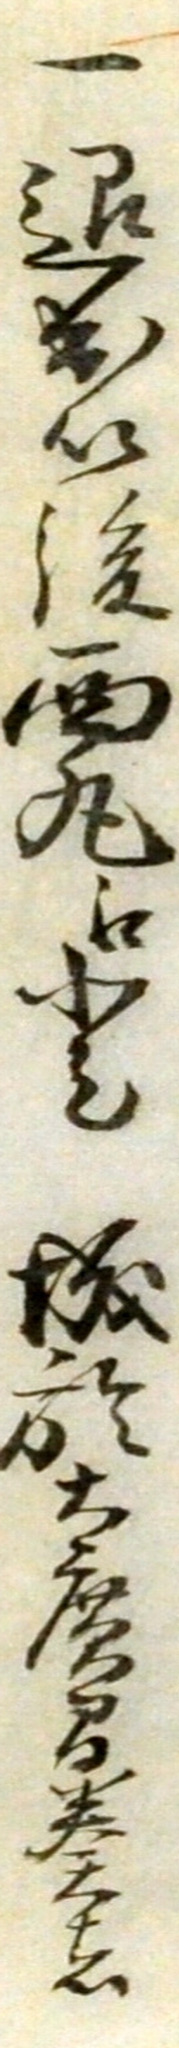一退出以後西丸え登城於大広間奏者
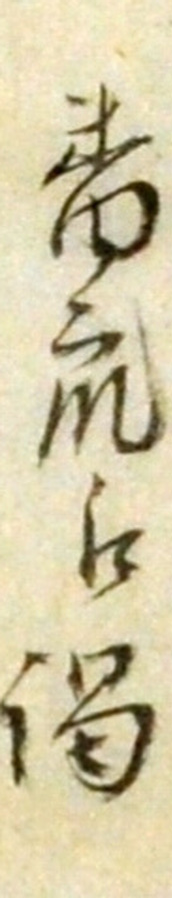番衆え謁

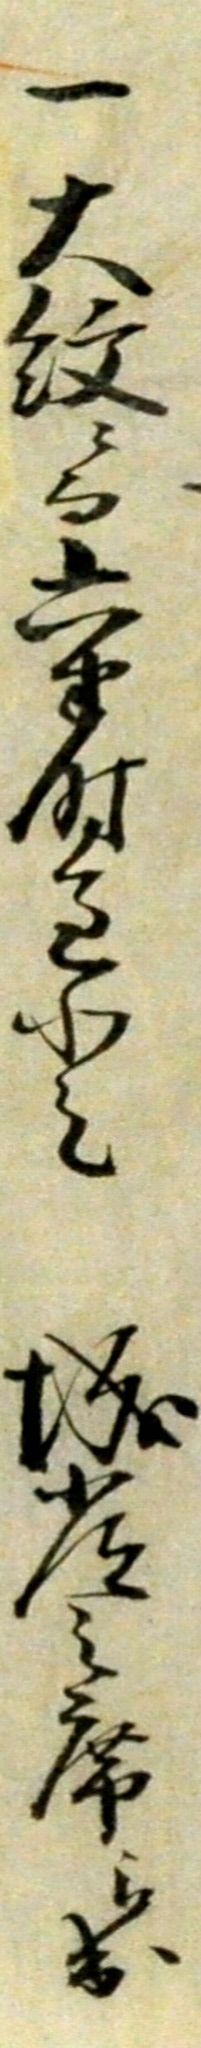一大紋にて六半時過登城常之席え出
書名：申合帳〔一括〕
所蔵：伊那市立高遠町図書館・合同会社AMANE
